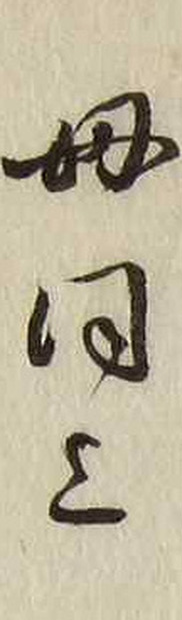母同上

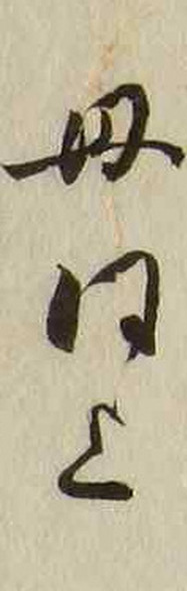母同上
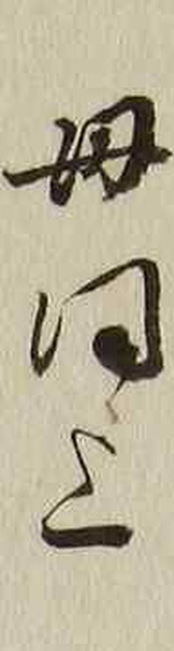母同上
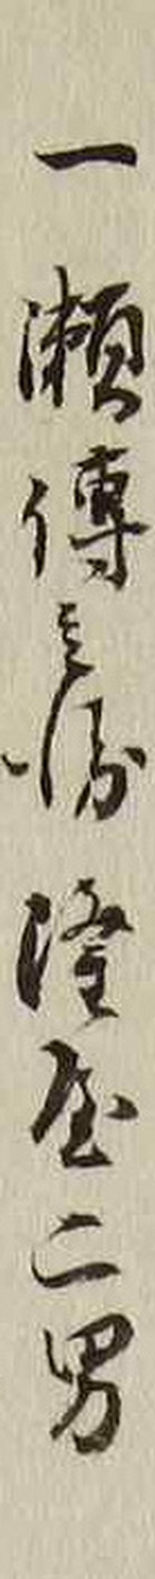一瀬伝兵衛隆屋二男
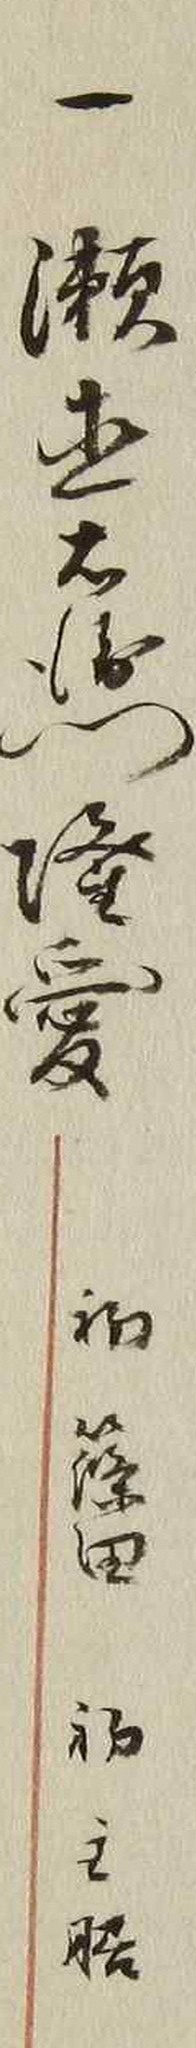一瀬直右衛門隆愛初篠田初主膳
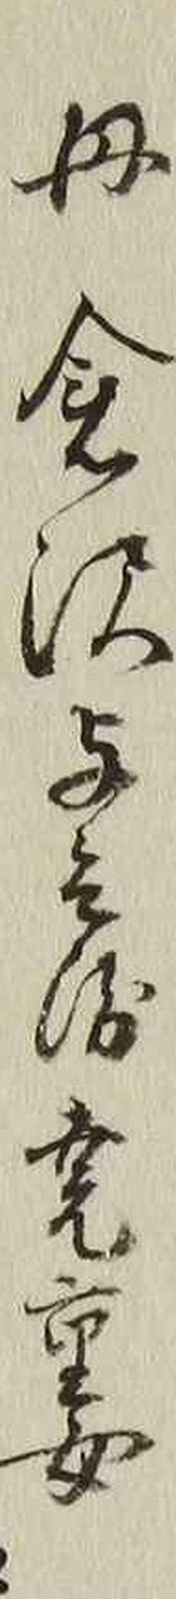母倉沢与兵衛尭重妻
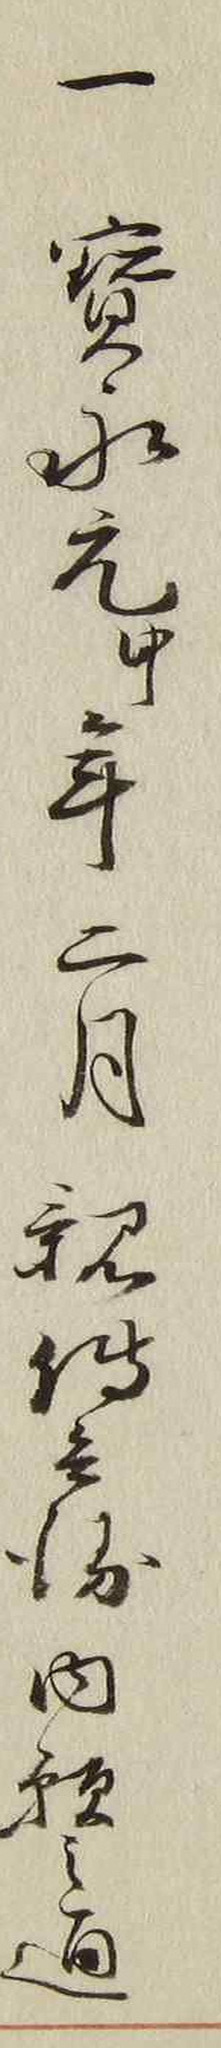一宝永元申年二月親伝兵衛内願之通
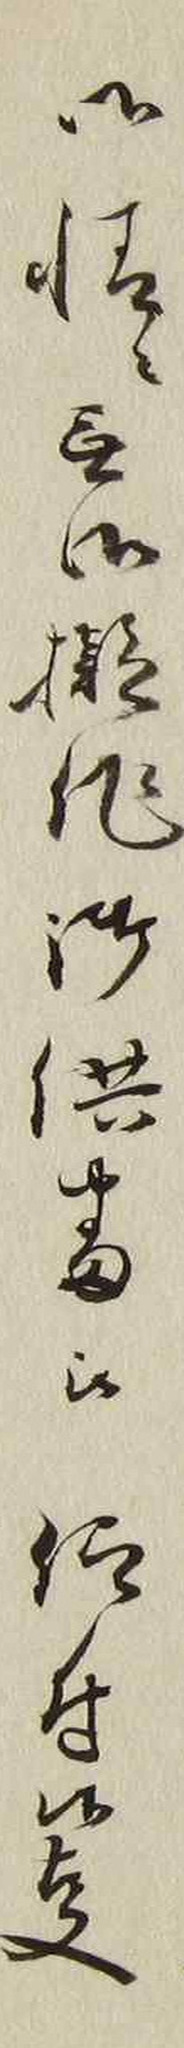御情ニ無御擬作御供番被仰付候事
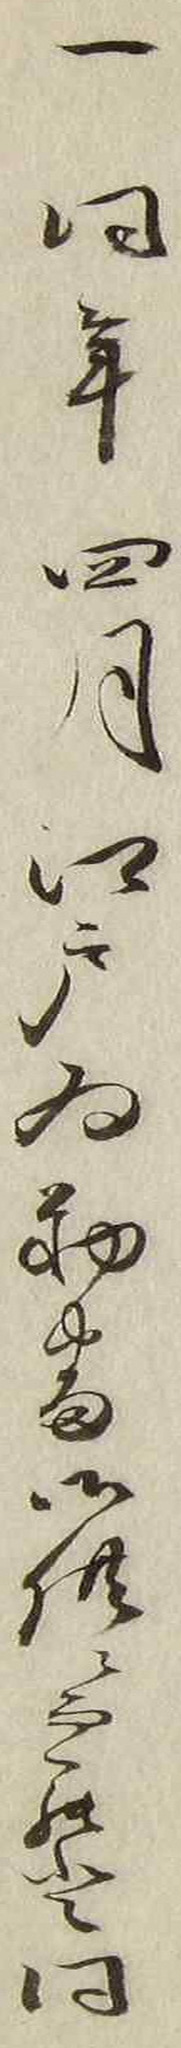一同年四月江戸為勤番御供ニ而罷登同
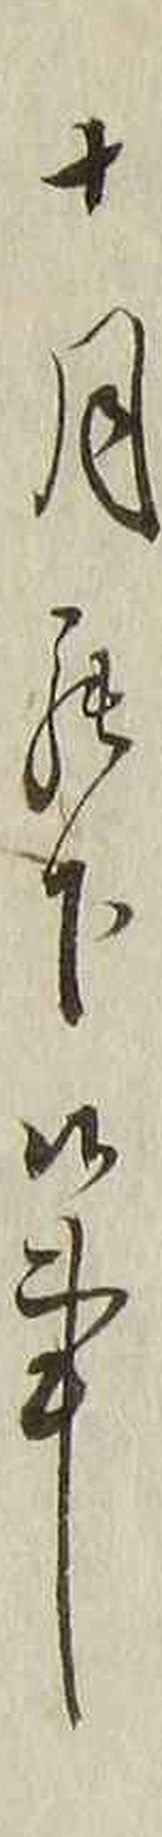十月罷下候事

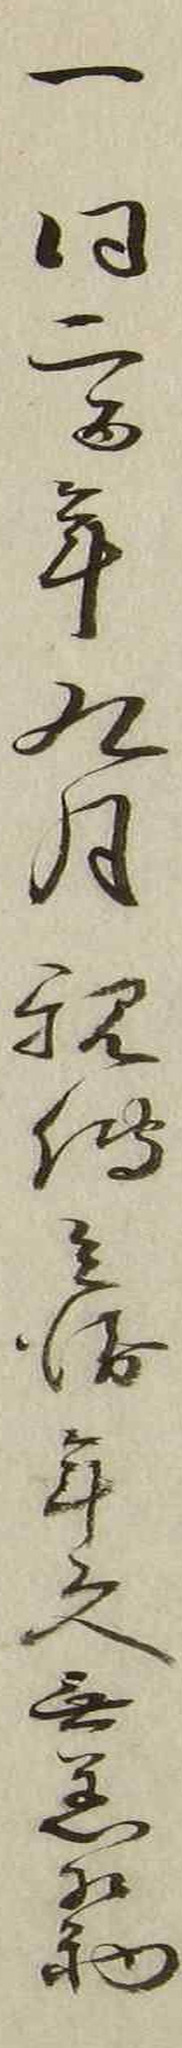一同二酉年九月親伝兵衛年久無恙相勤
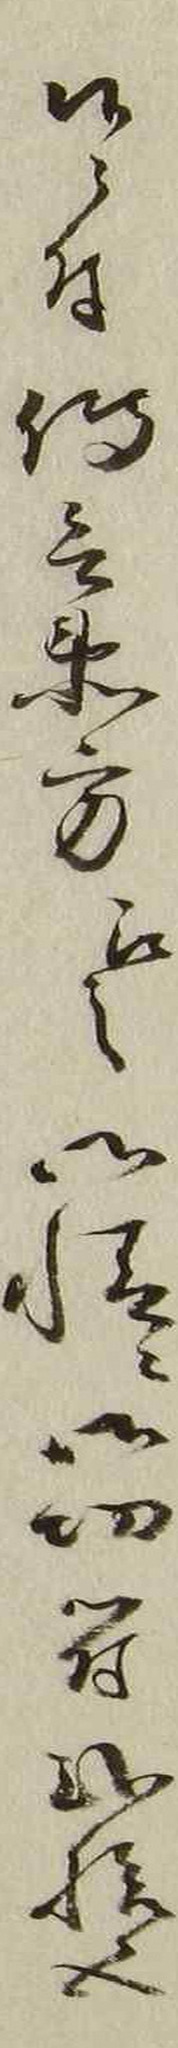候ニ付伝兵衛方江之御情ニ御切符弐拾五
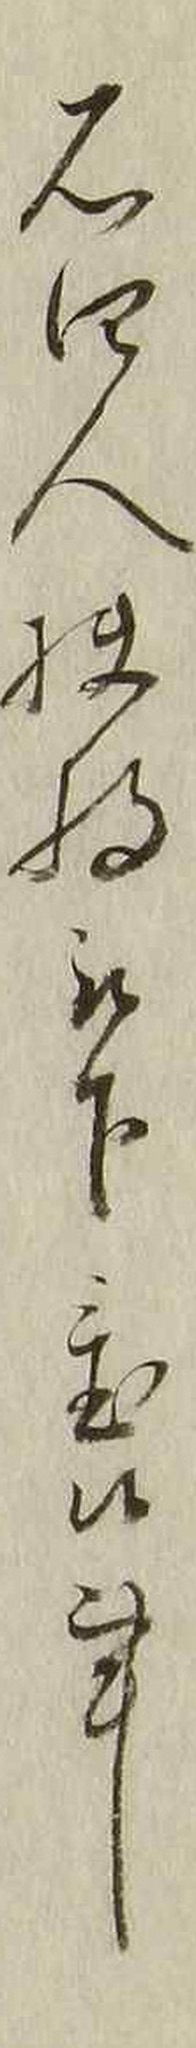石四人扶持被下置候事
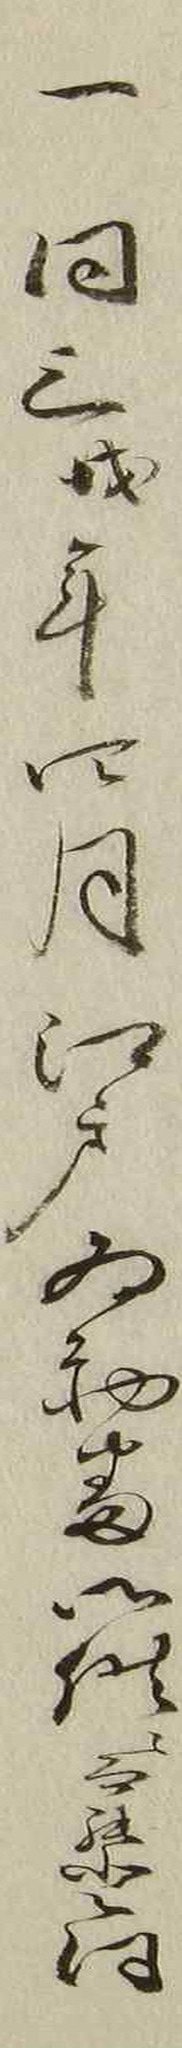一同三戌年四月江戸為勤番御供ニ而罷登同
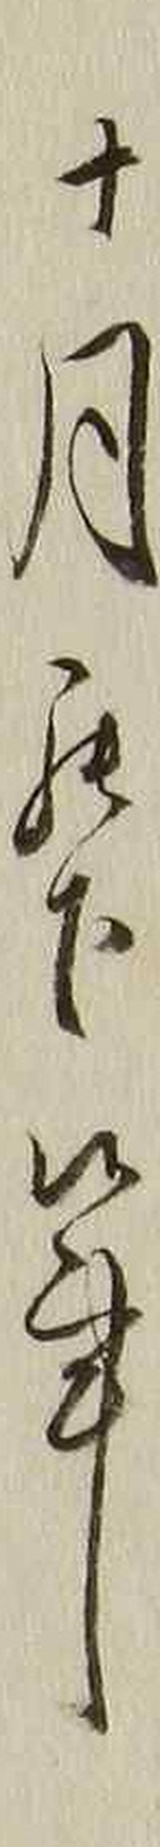十月罷下候事
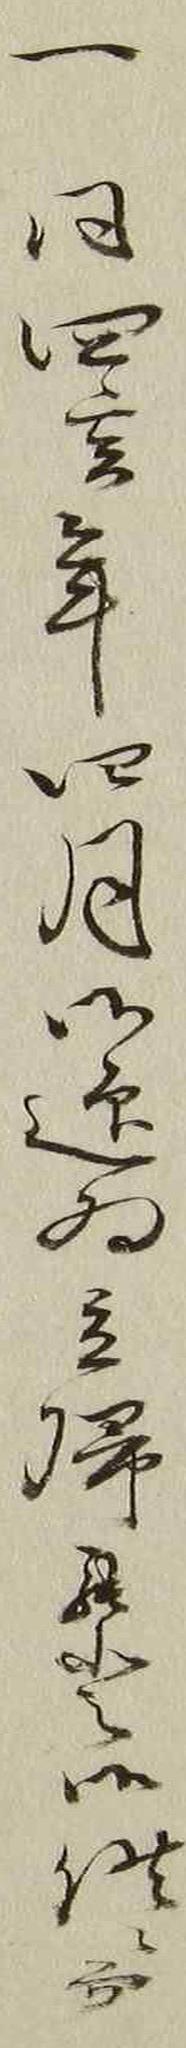一同四亥年四月御迎為立帰罷登御供ニ而
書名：諸士系譜　巻之26　い之部26
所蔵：会津若松市立会津図書館
